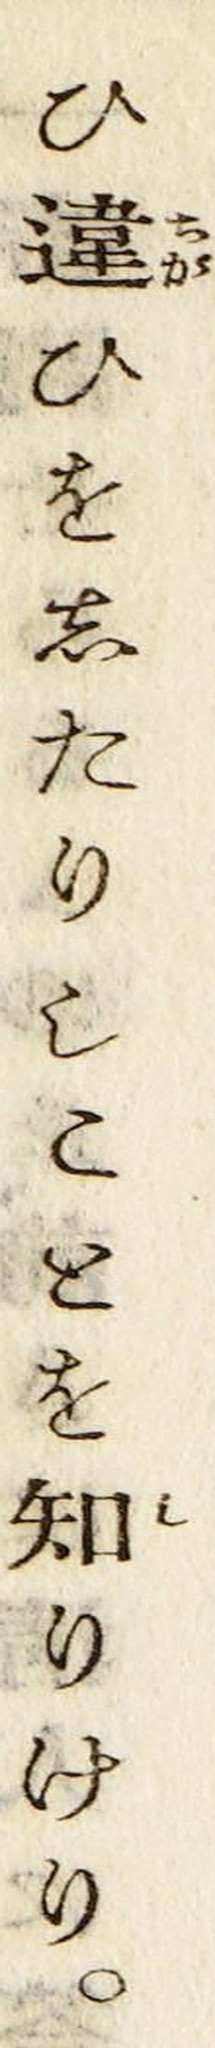ひ違ひをしたりしことを知りけり。

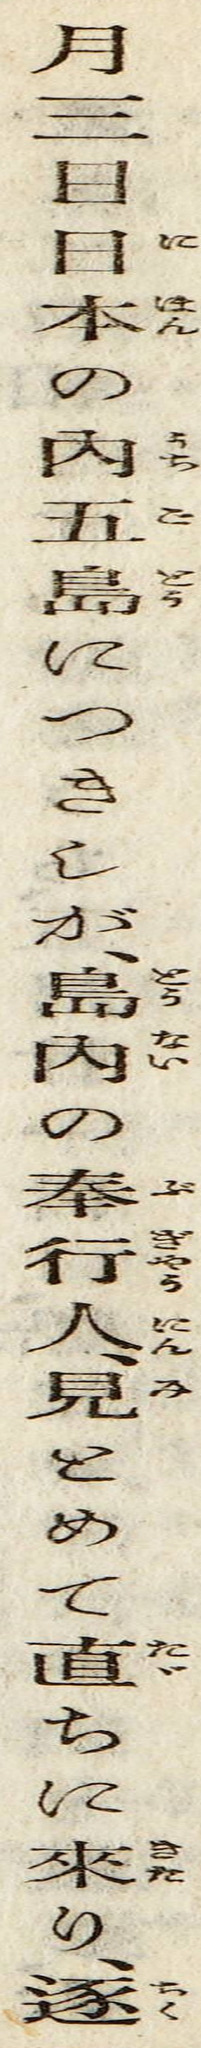月三日日本の内五島につきしが、島内の奉行人、見とめて直ちに来り、逐
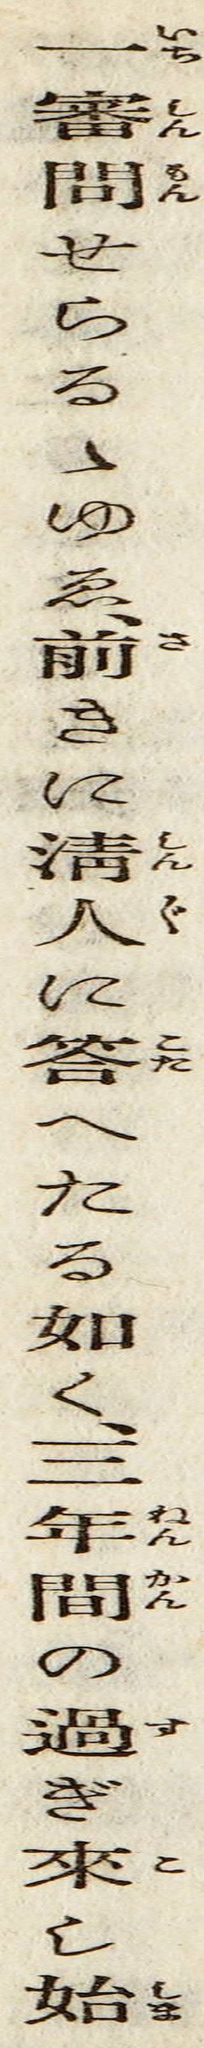一審問せらるゝゆゑ、前きに清人に答へたる如く、三年間の過ぎ来し始
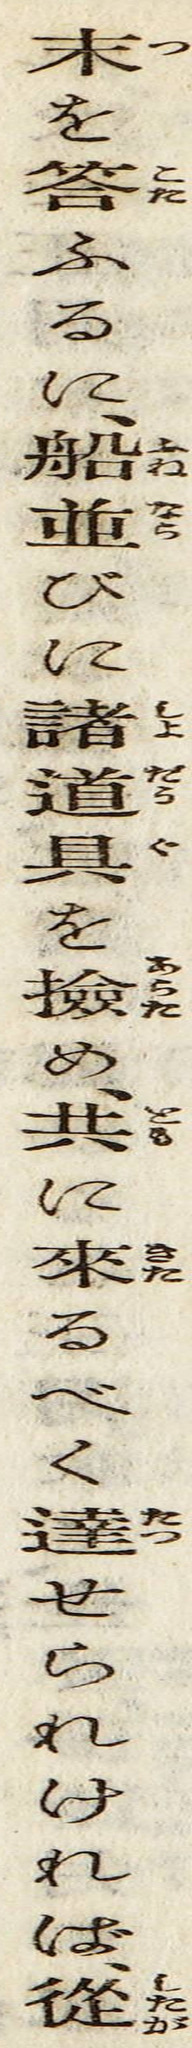末を答ふるに、船並びに諸道具を撿め、共に来るべく達せられければ、従
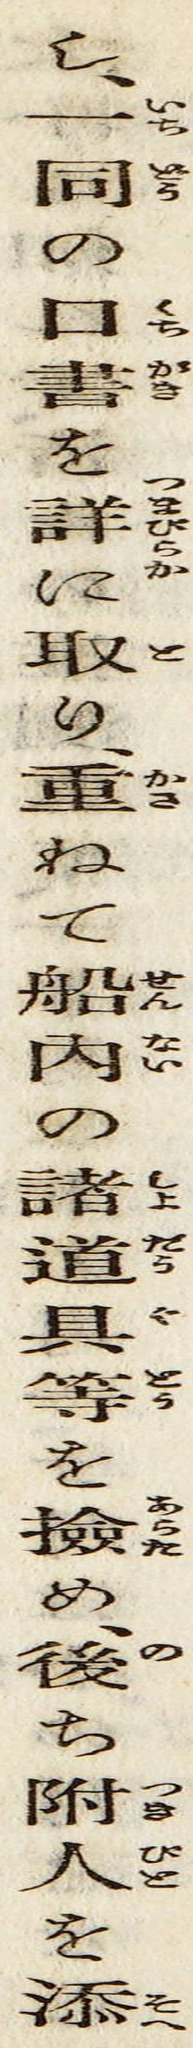し、一同の口書を詳に取り、重ねて船内の諸道具等を撿め、後ち附人を添
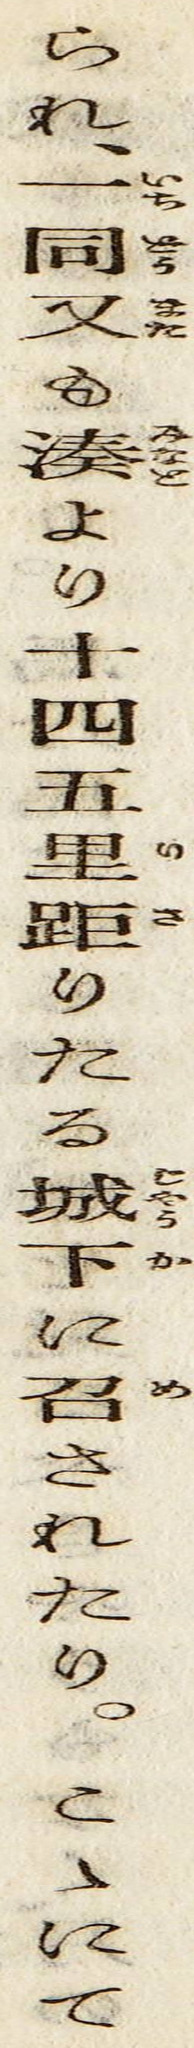られ、一同又も湊より十四五里距りたる城下に召されたり。こゝにて
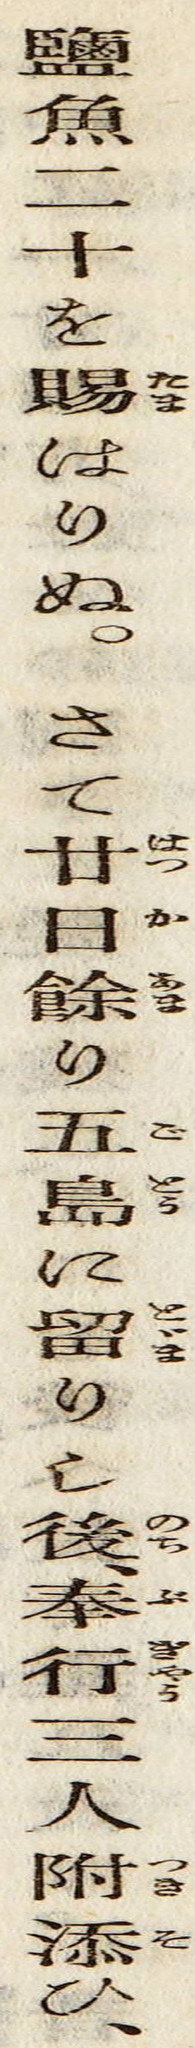塩魚二十を賜はりぬ。さて廿日余り五島に留りし後、奉行三人附添ひ、
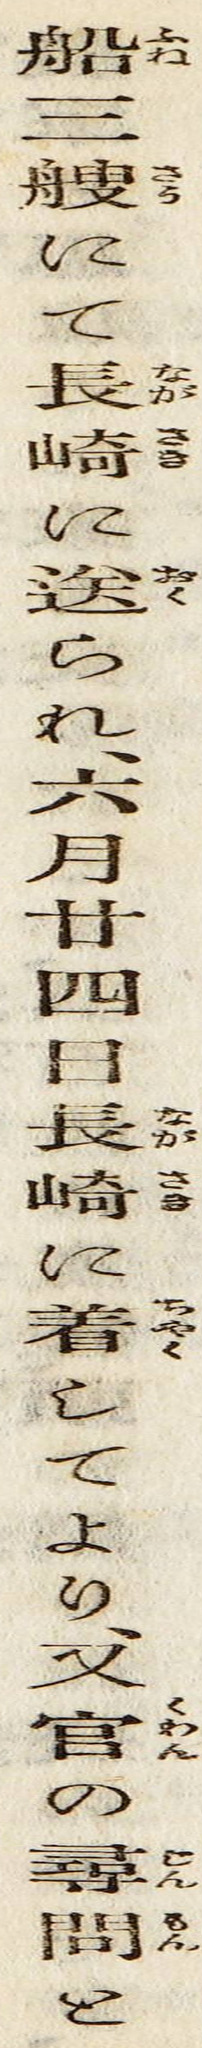船三艘にて長崎に送られ、六月廿四日長崎に着してより、又官の尋問と
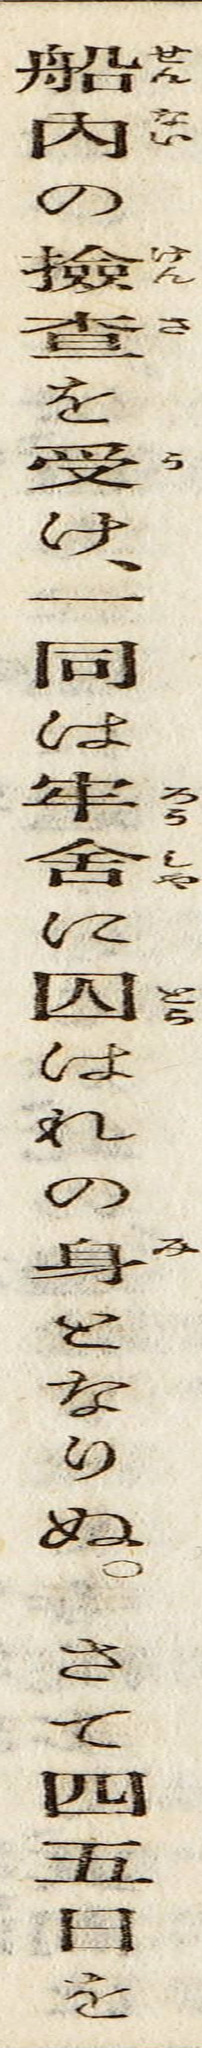船内の撿査を受け、一同は牢舎に囚はれの身となりぬ。さて四五日を
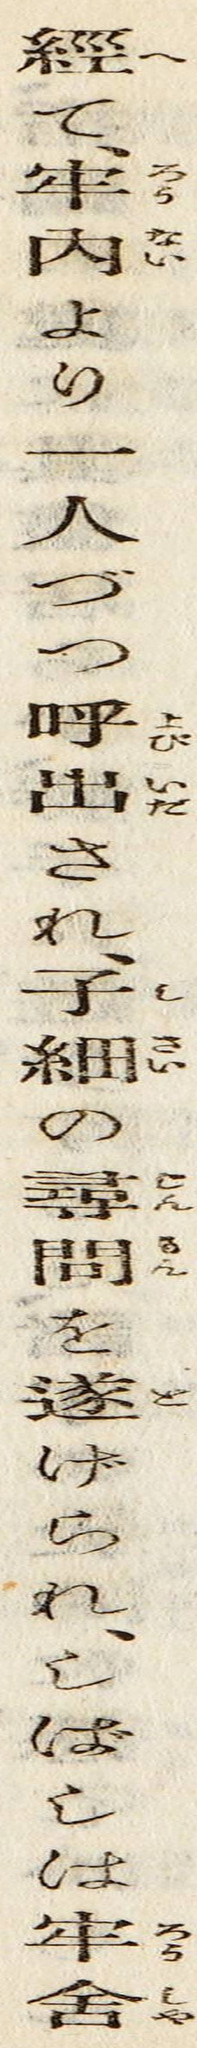経て、牢内より一人づつ呼出され、子細の尋問を遂げられ、しばしは牢舎
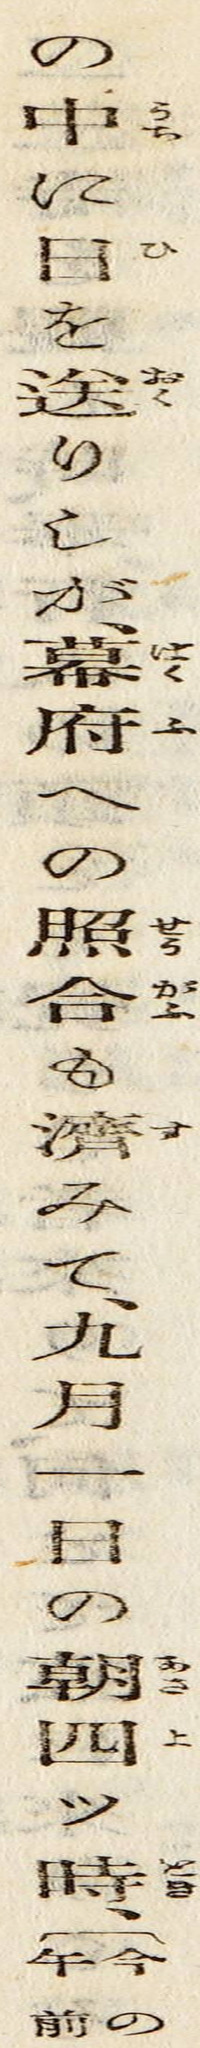の中に日を送りしが、幕府への照合も済みて、九月一日の朝四ツ時、[今の午前
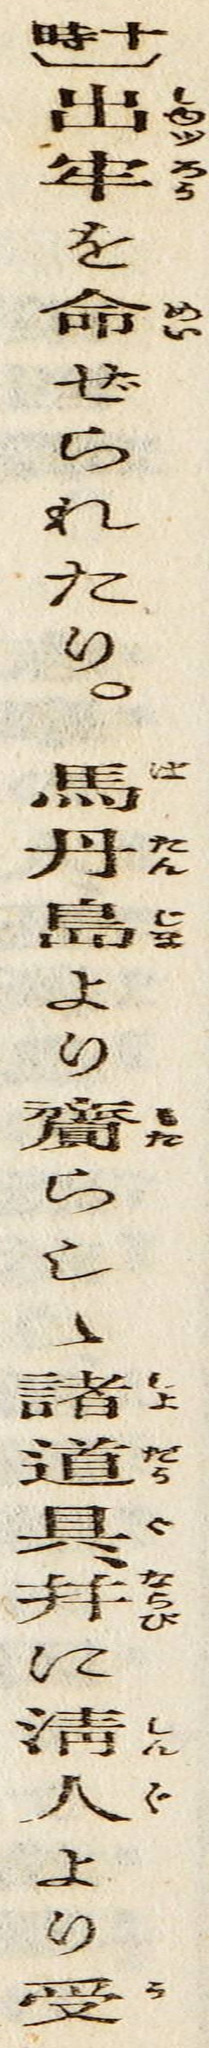十時]出牢を命ぜられたり。馬丹島より齎らしゝ諸道具、并に清人より受
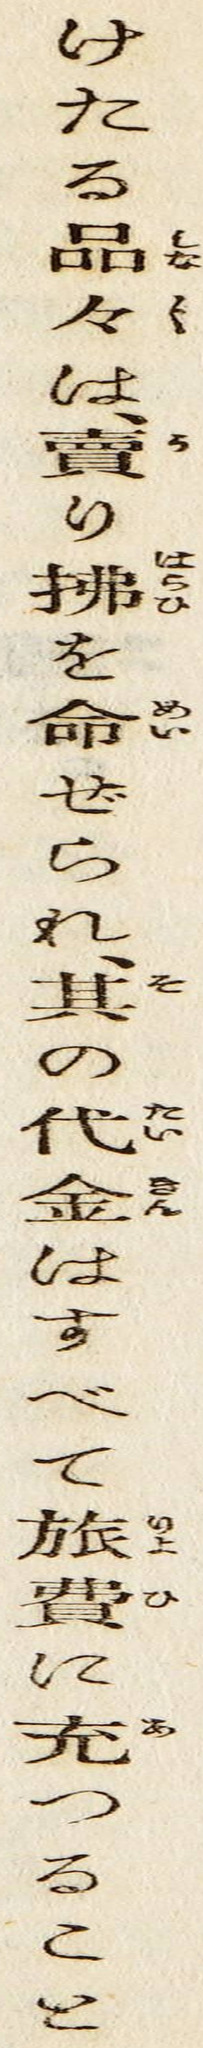けたる品々は、売り払を命ぜられ、其の代金はすべて旅費に充つること
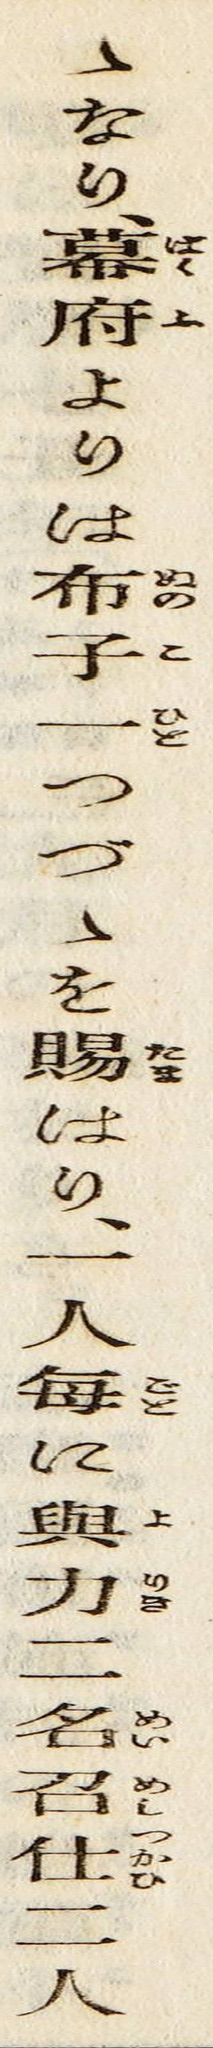ゝなり、幕府よりは布子一つづゝを賜はり、一人毎に与力二名召仕二人
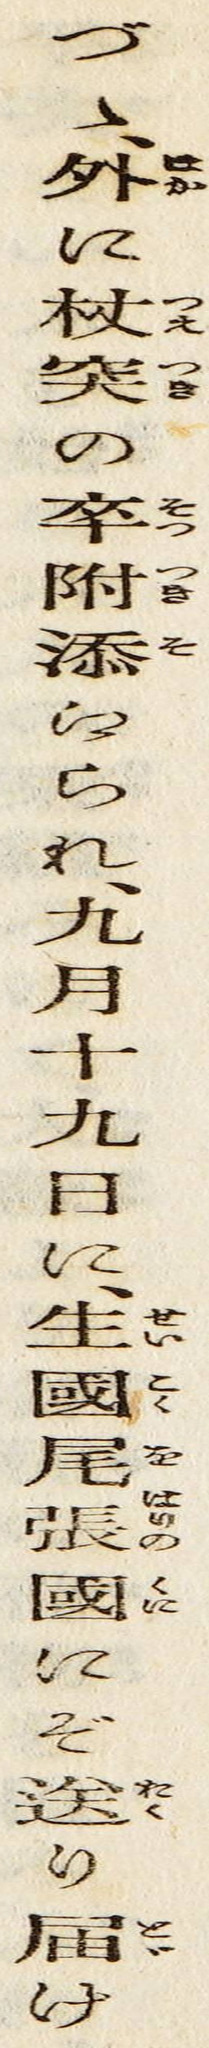づゝ、外に杖突の卒附添えられ、九月十九日に、生国尾張国にぞ送り届け
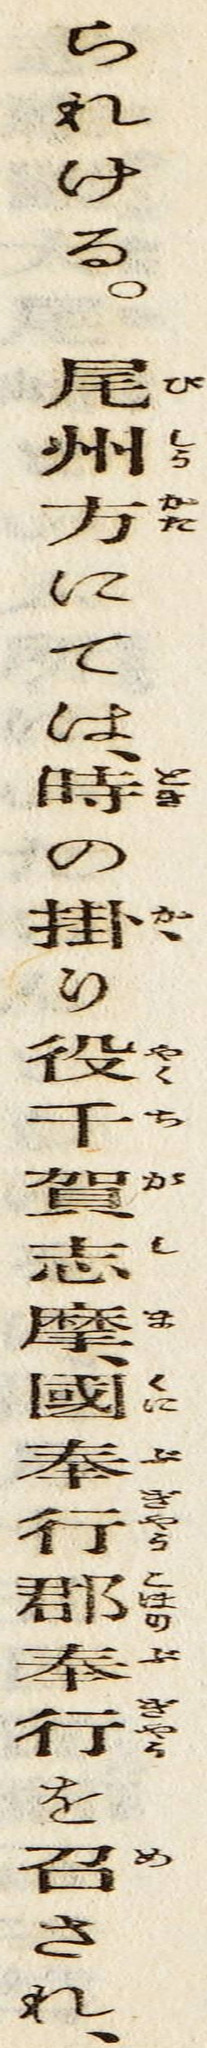られける。尾州方にては、時の掛り役千賀志摩、国奉行郡奉行を召され、
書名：日本漂流譚
